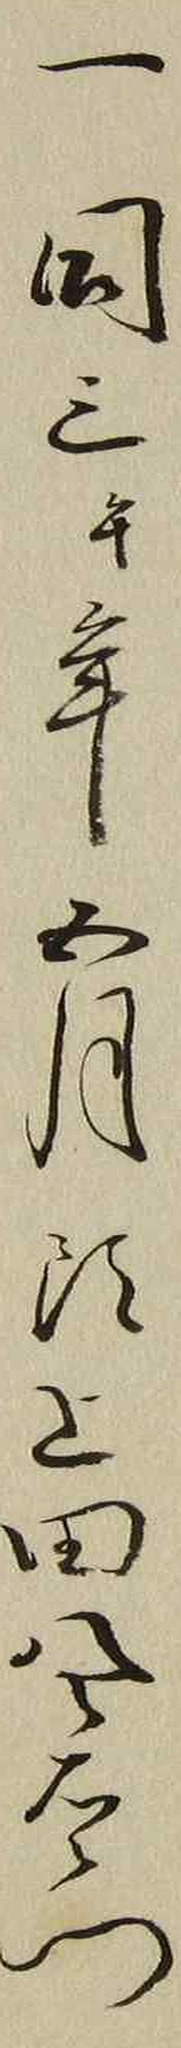一同三午年五月頭上田八郎右衛門
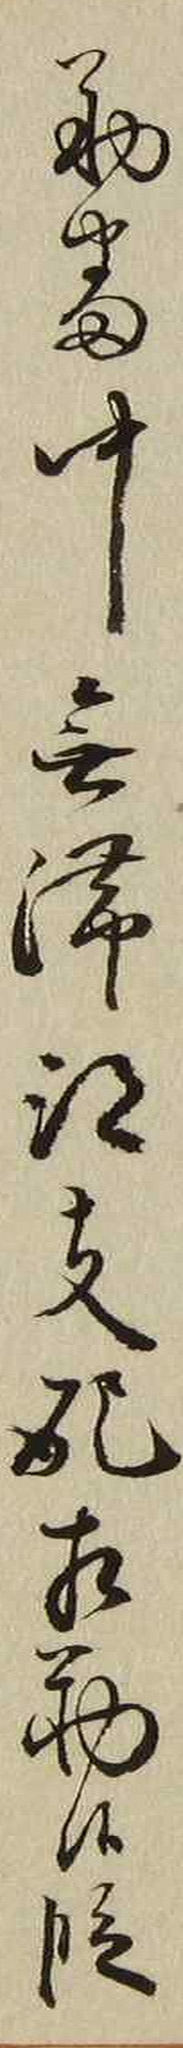勤番中無滞跡支配相勤候段
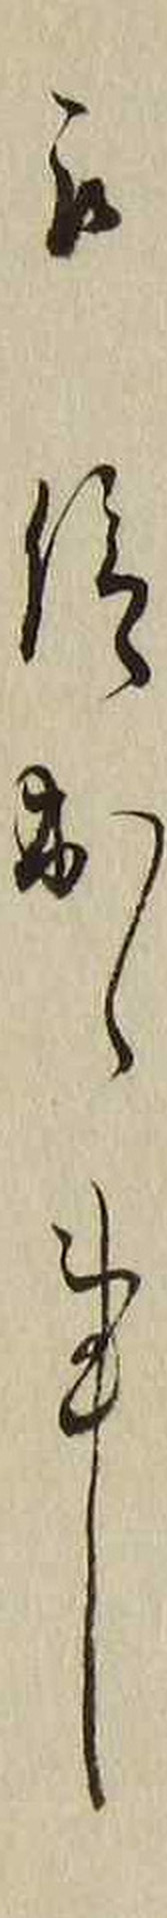被仰出候事
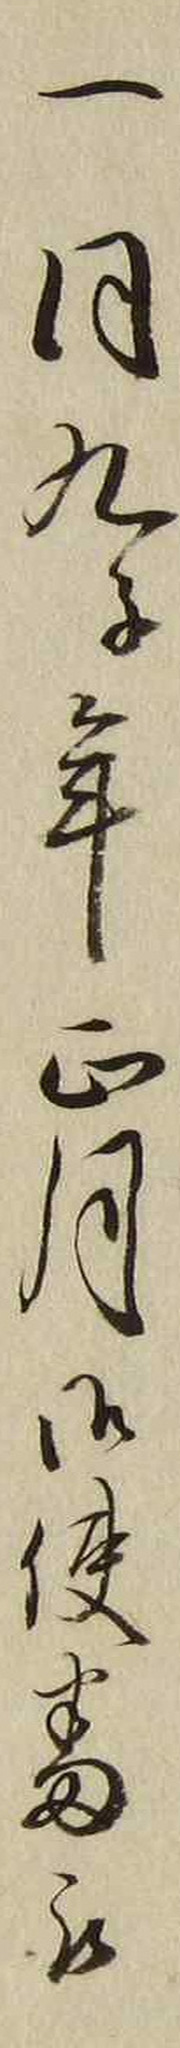一同九子年正月御使番被

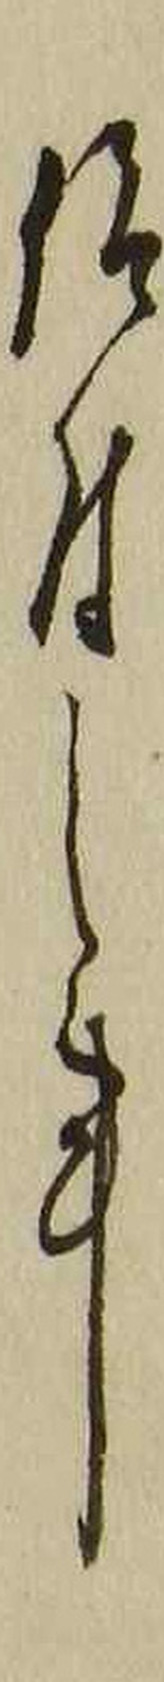仰付候事
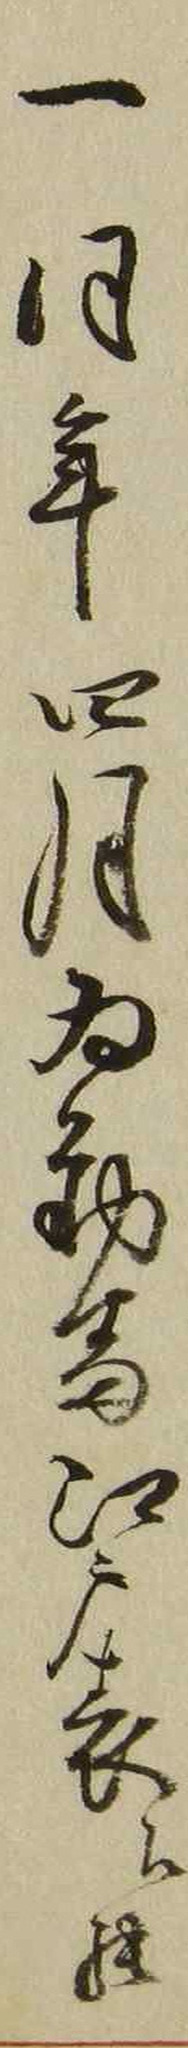一同年四月為勤番江戸表江罷
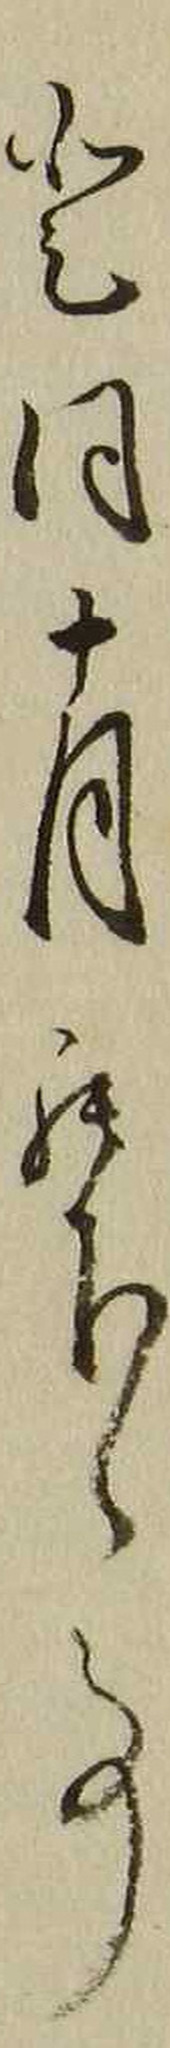登同十月罷下候事
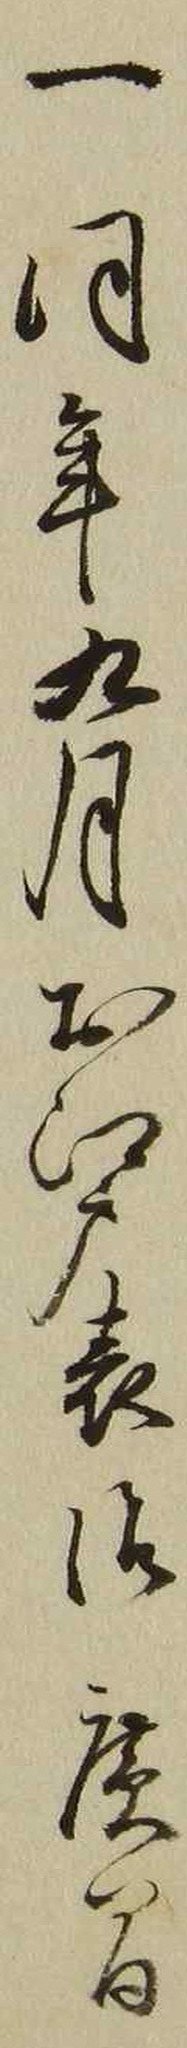一同年九月於江戸表御広間
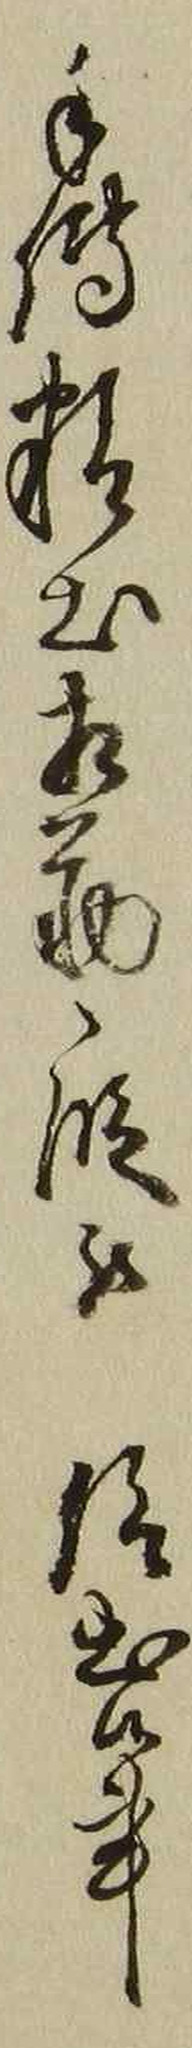手伝精出相勤候段被仰出候事
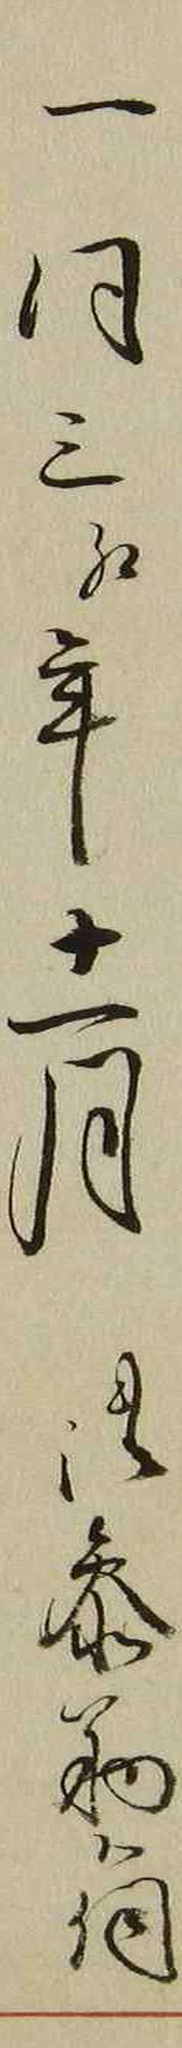一同三卯年十一月御参勤御伺
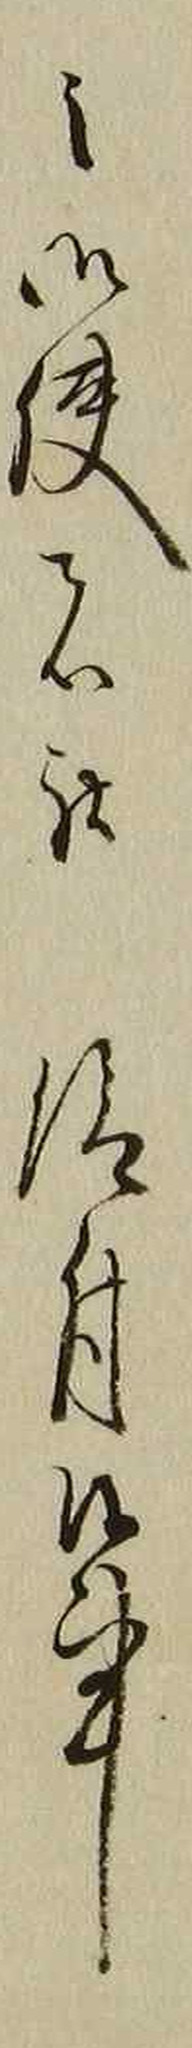之御使者被仰付候事
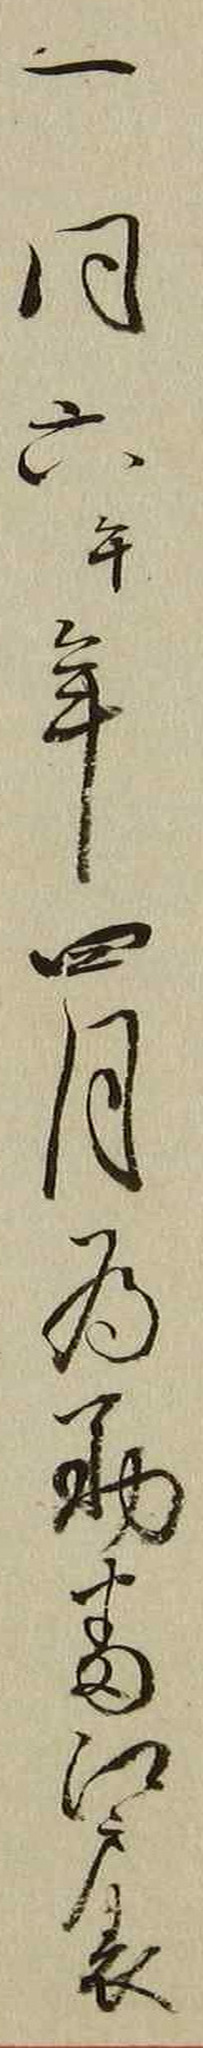一同六午年四月為勤番江戸表
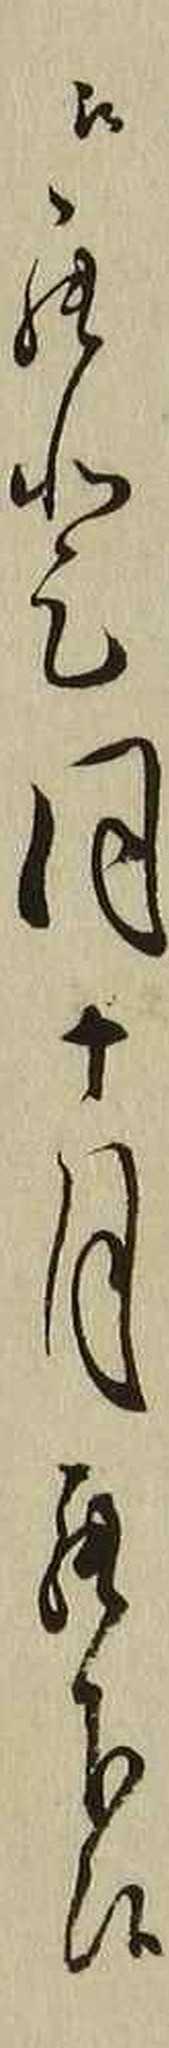江罷登同十月罷下候
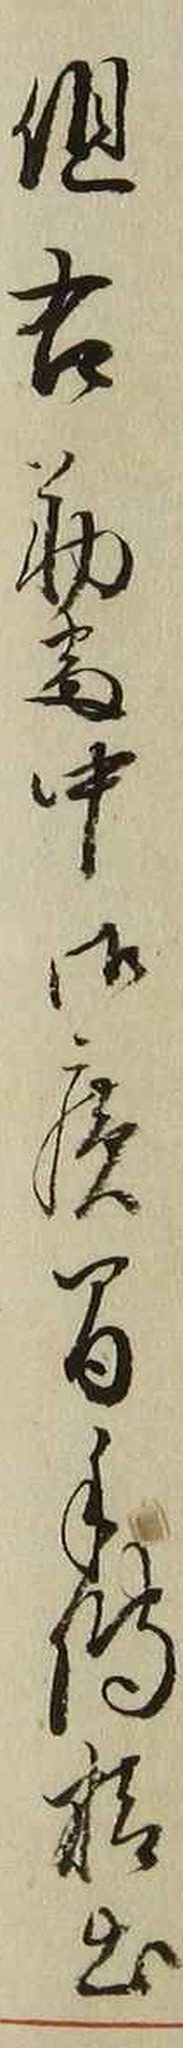但右勤番中御広間手伝精出
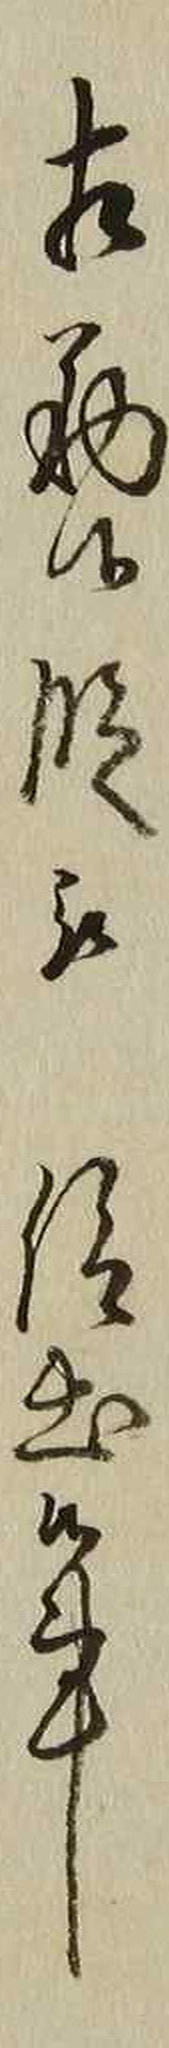相勤候段被仰出候事
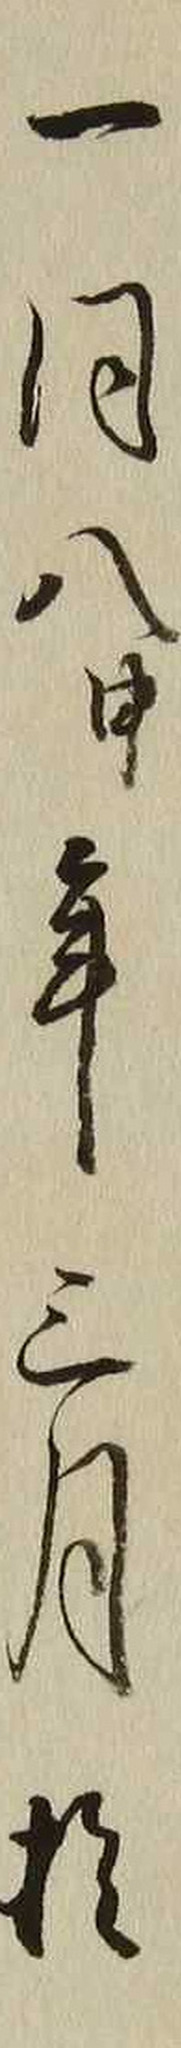一同八申年三月於
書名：諸士系譜　巻之1　い之部1
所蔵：会津若松市立会津図書館
